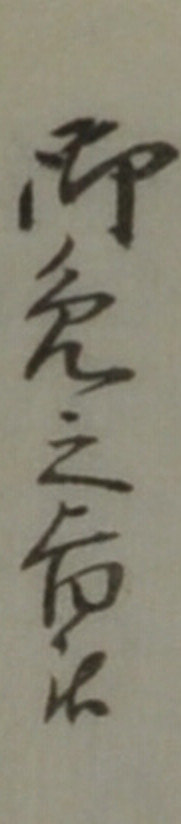御免之旨被仰出之
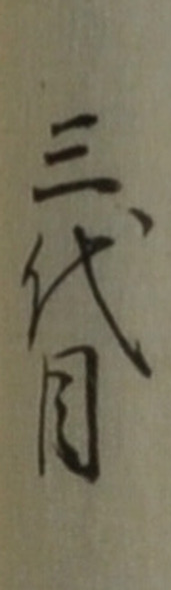三代目
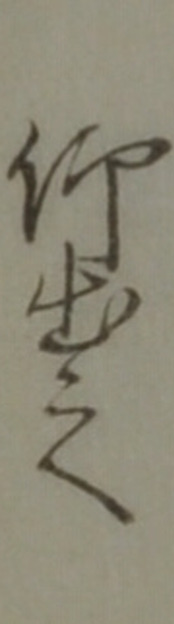仰付之
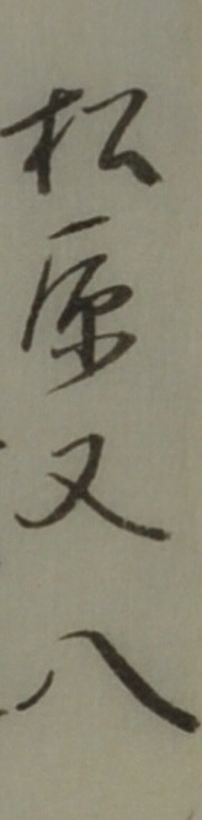松原又八
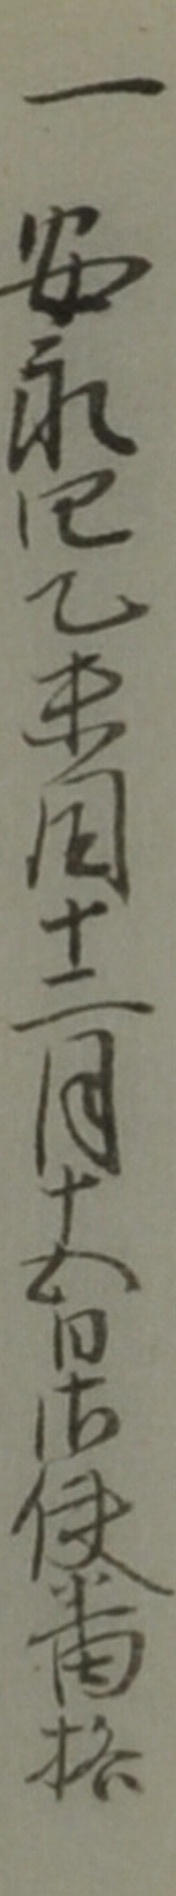一安永四乙未同十二月十五日御使番格
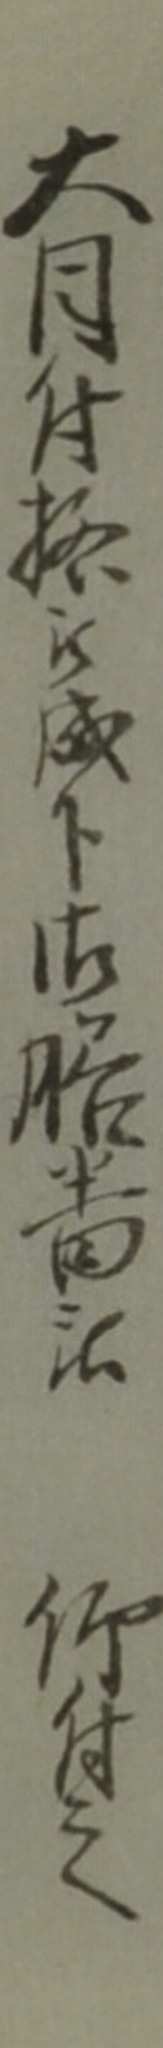御目付格被成下御膳番被仰付之
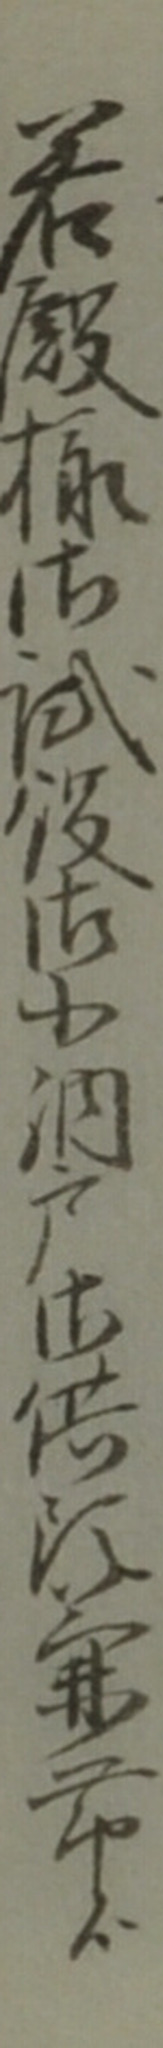若殿様御試役御小納戸御供頭兼帯
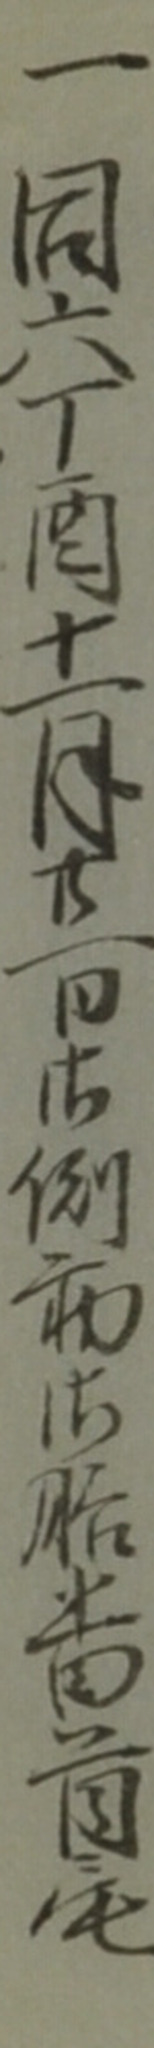一同六丁酉十一月廿一日御側勤御膳番首尾
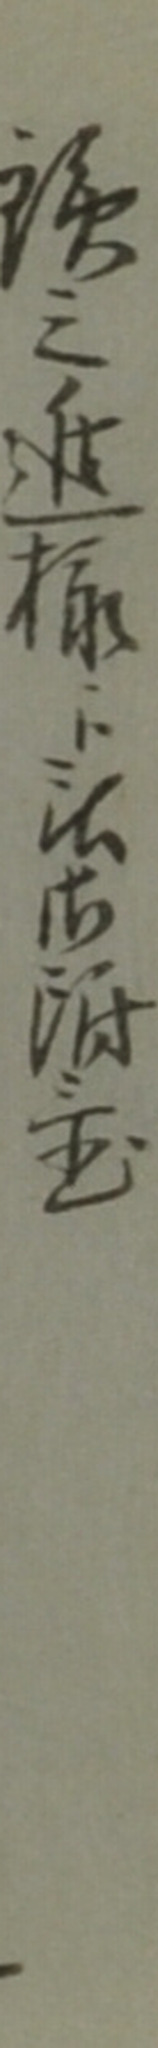鉄三近様江被御附置
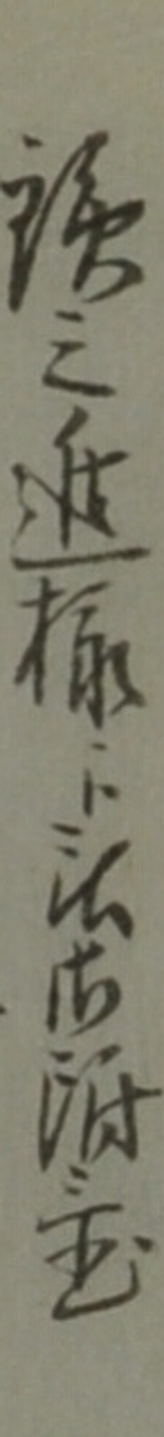鉄三近様江被御附置
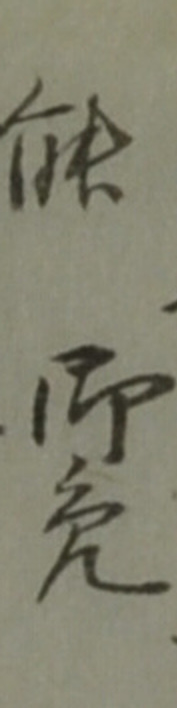能御免
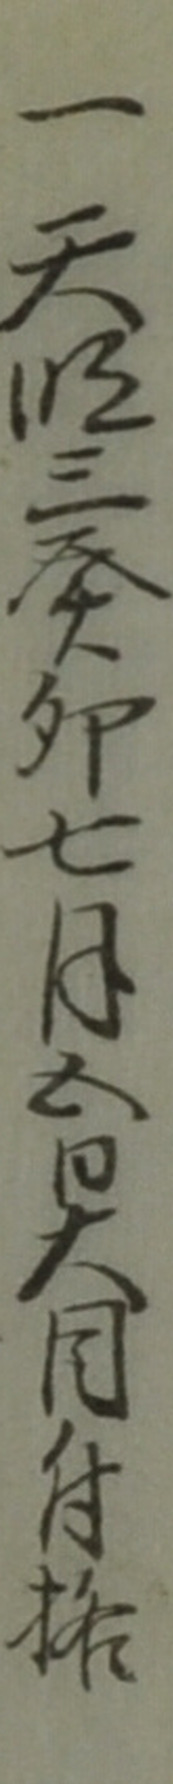一天明三癸卯七月五日大目付格
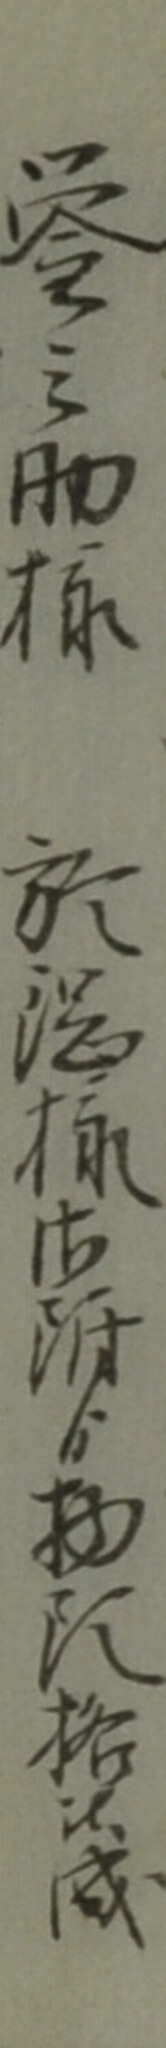釜之助様於綱様御附ゟ物頭格被成
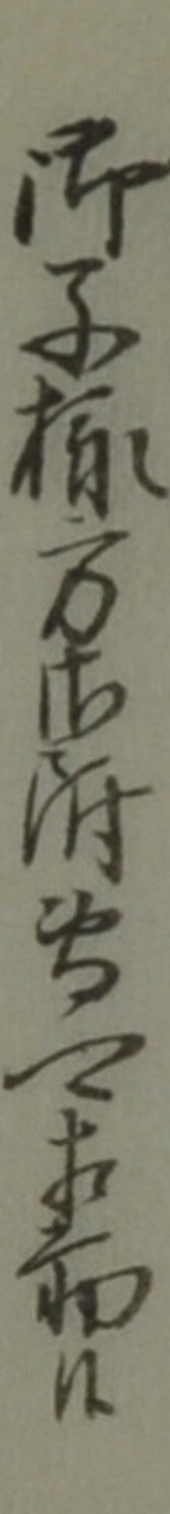一御子様方御附専可相勤候
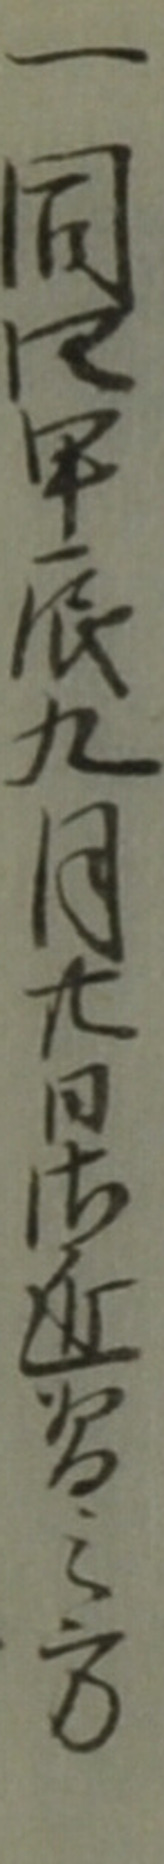一同四甲辰九月廿日御近習之方
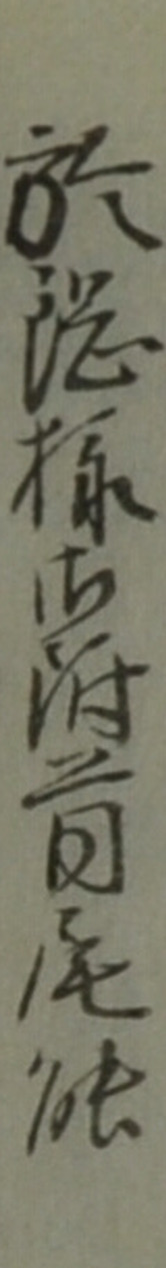於綱様御附首尾能御免
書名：諸御役代々録（四）
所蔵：伊那市立高遠町図書館・合同会社AMANE
